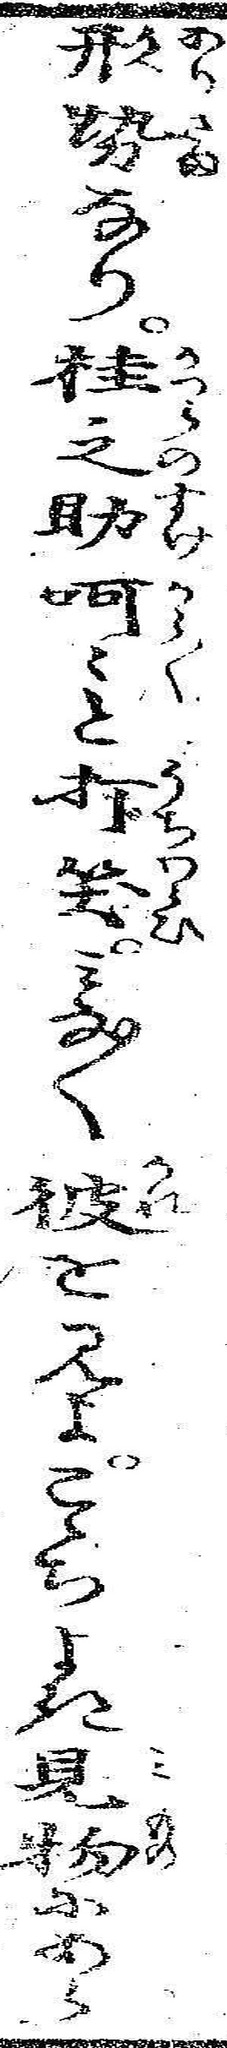形勢なり。桂之助呵々と打笑。みな〳〵彼を見よ。こゝちよき見物にあら
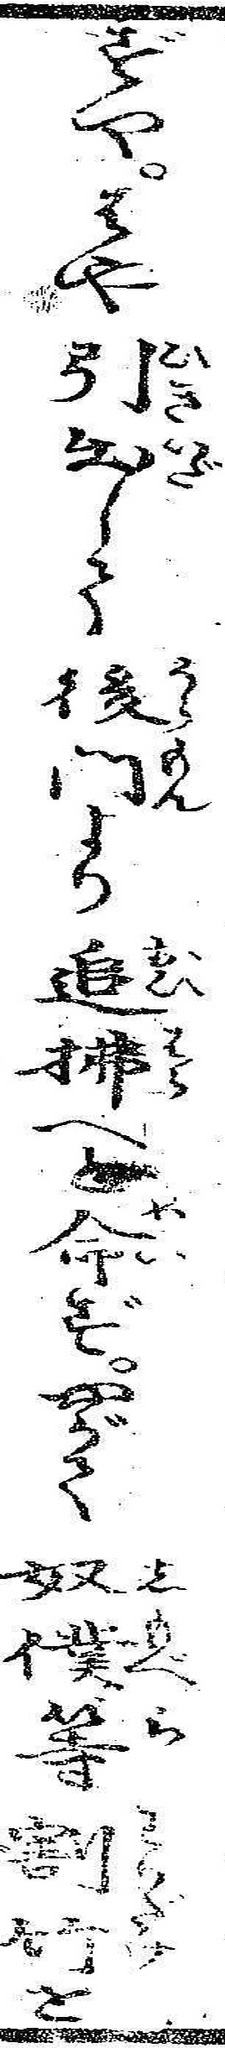ずや。はや引出して後門より追払へと命ず。やがて奴僕等割竹を
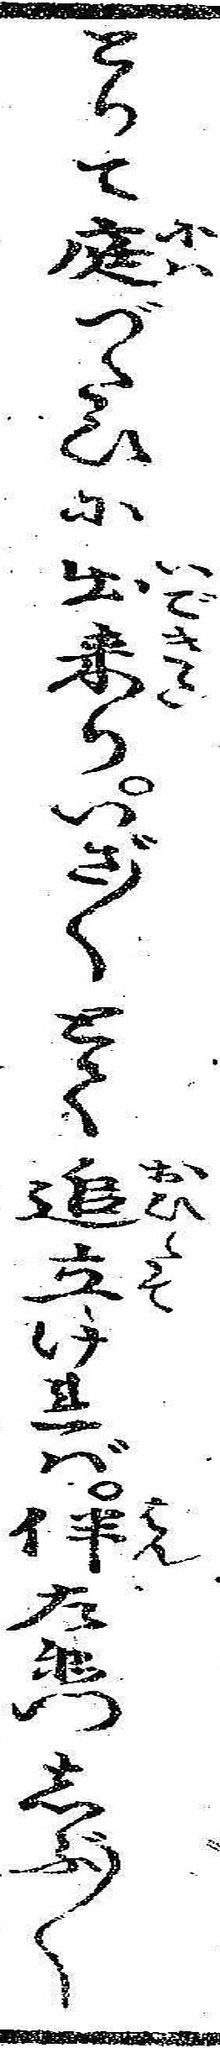とりて庭づたひに出来り。いざ〳〵とて追立ければ。伴左衛門しぶ〳〵
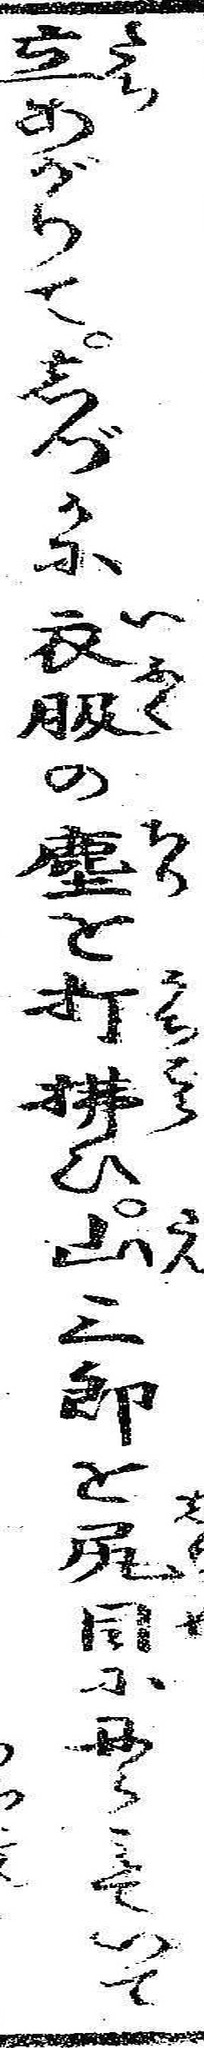立あがりて。しづかに衣服の塵を打払ひ。山三郎を尻目ににらみていて
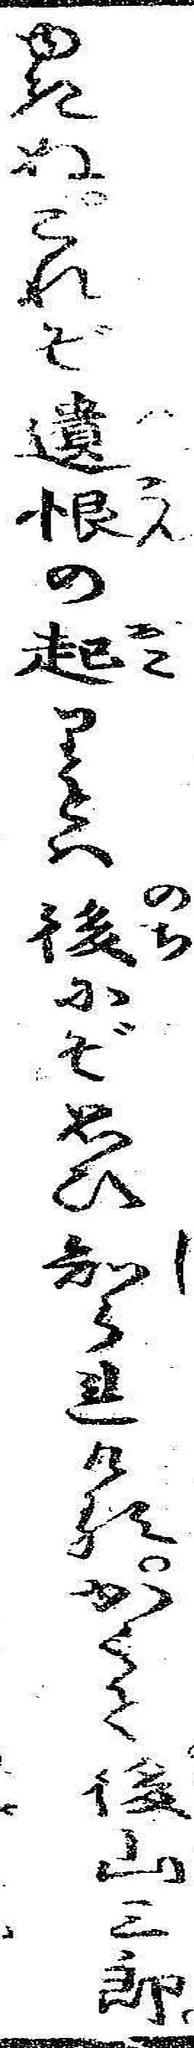ゆきぬ。これぞ遺恨の起りとは後にぞ思ひ知られける。かくて後山三郎。
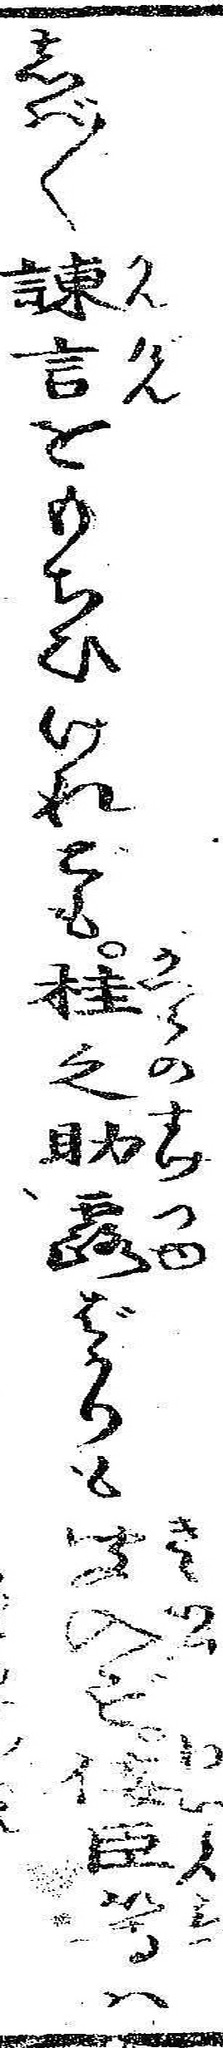しば〳〵諌言をもちひけれども。桂之助露ばかりも聞入ず。佞臣等は
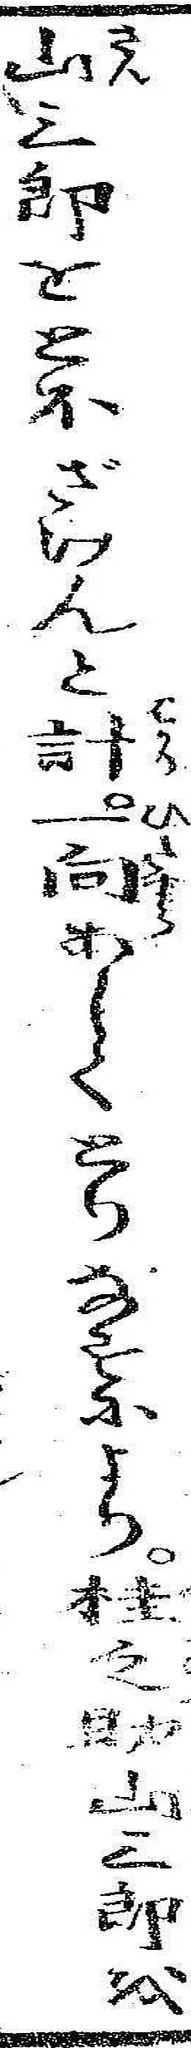山三郎をとほざけんと計。一向あしくとりなすにより。桂之助山三郎を
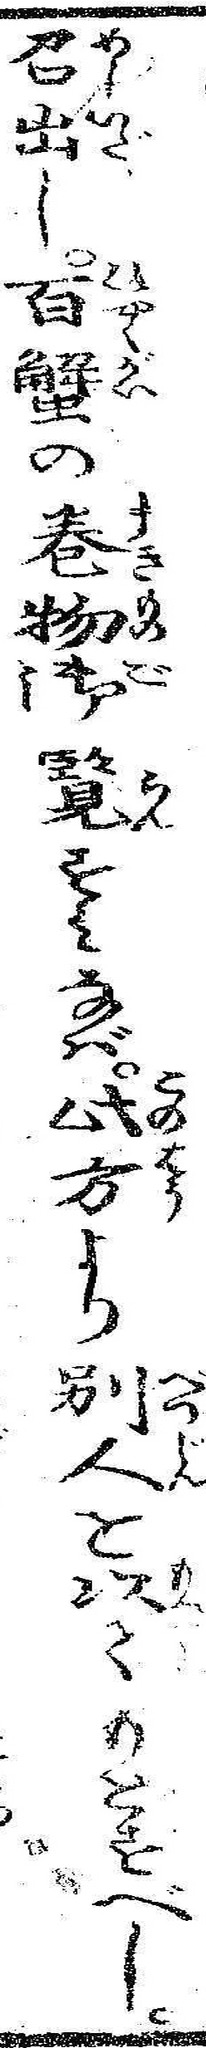召出し。百蟹の巻物御覧すみなば。此方より別人を以てもとすべし。
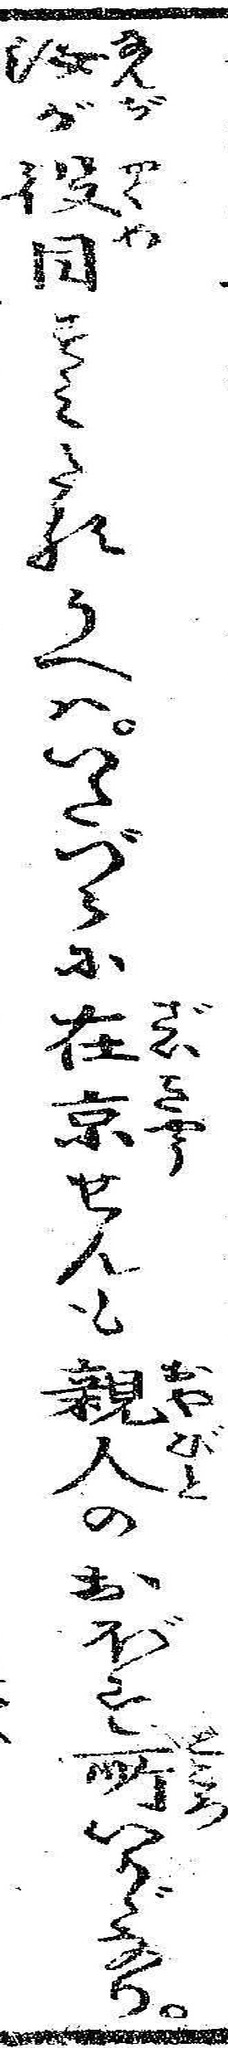汝が役目すみたるうへは。いたづらに在京せんも親人のおぼす所いかゞなり。
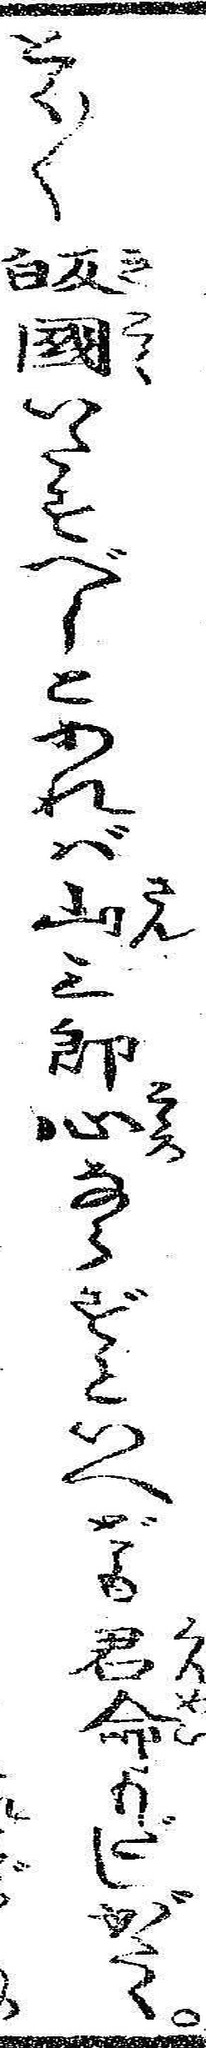とく〳〵帰国いたすべしとあれば山三郎心ならずといへども君命もだしがたく。
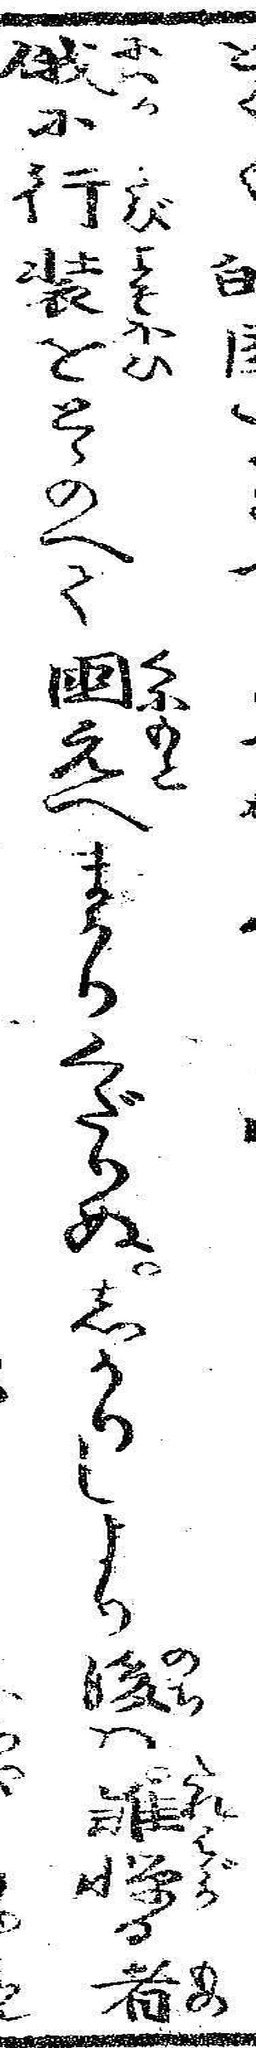俄に行装をとゝのへて国元へまかりくだりぬ。しかりしより後は。誰憚る者
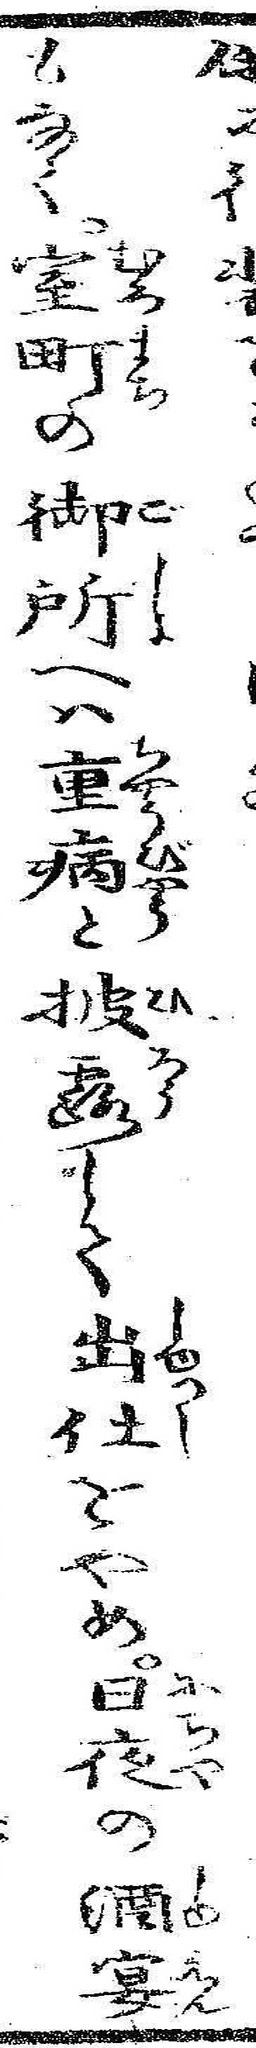もなく。室町の御所へは重病と披露して出仕をやめ。日夜の酒宴
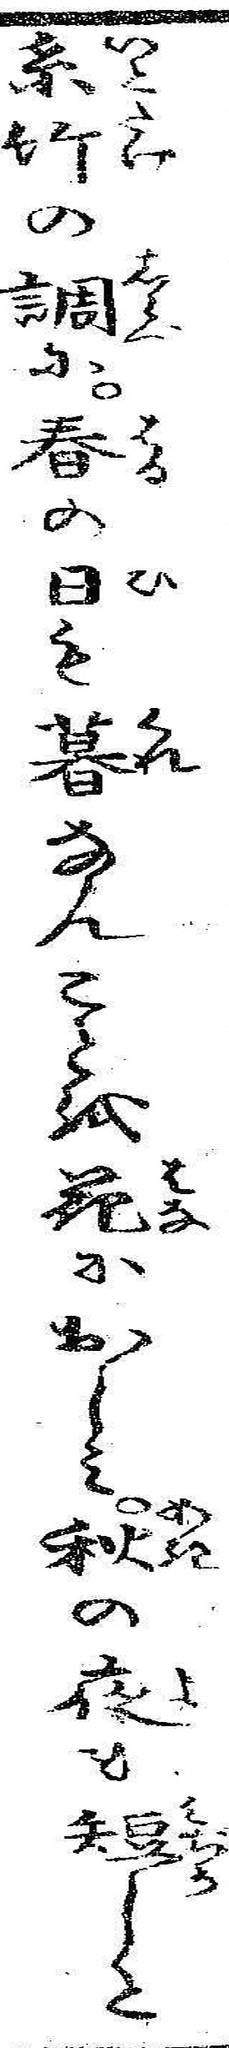糸竹の調に。春の日も暮なんことを花におしみ。秋の夜も短しと
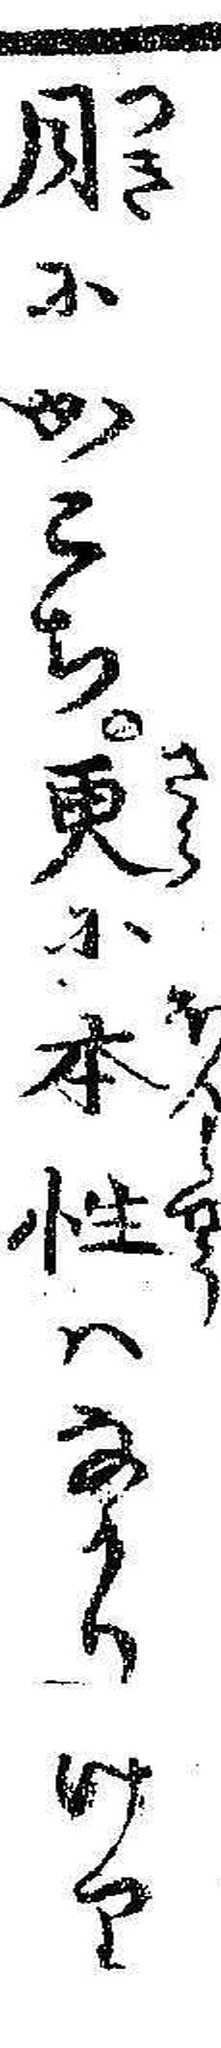月にかこち。更に本性はなかりけり

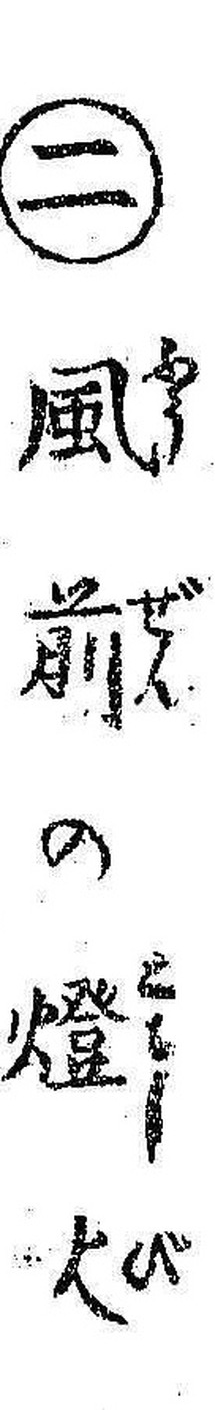二風前の灯火
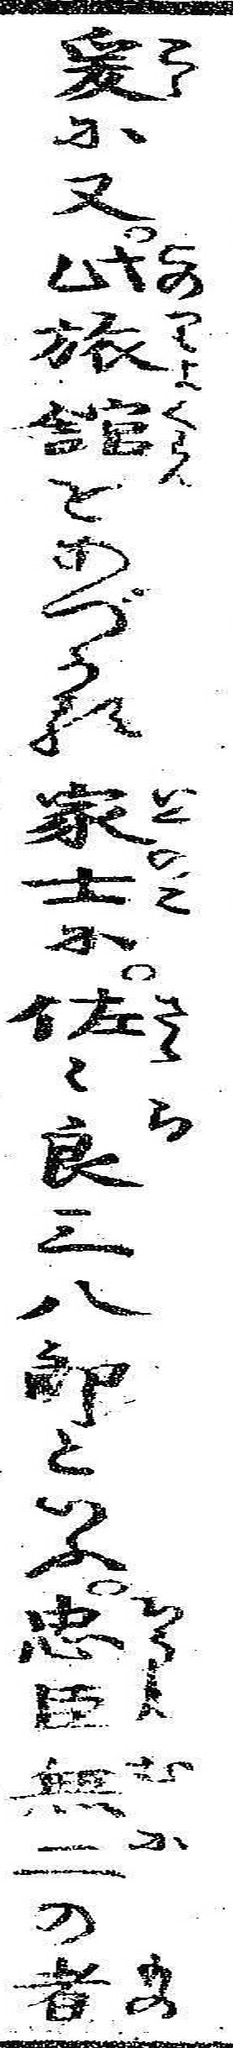爰に又。此旅館をあづかる家士に。佐々良三八郎といふ。忠臣無二の者
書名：昔話稲妻表紙
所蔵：国文学研究資料館
